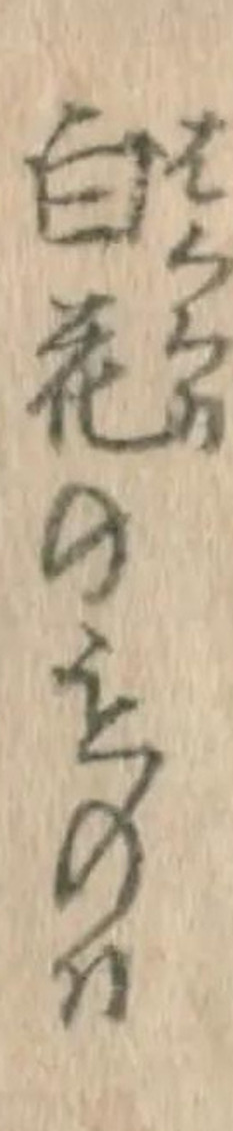白花のものは
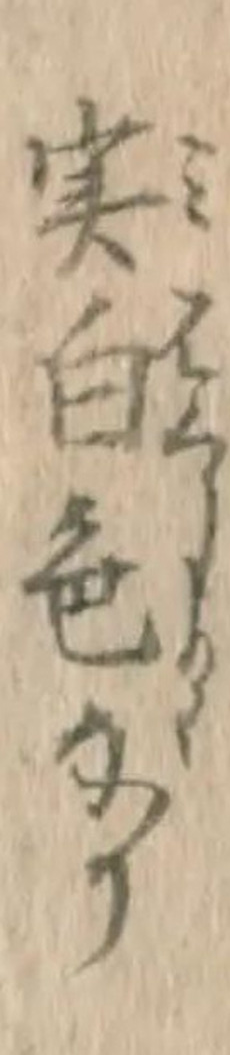実白色なり
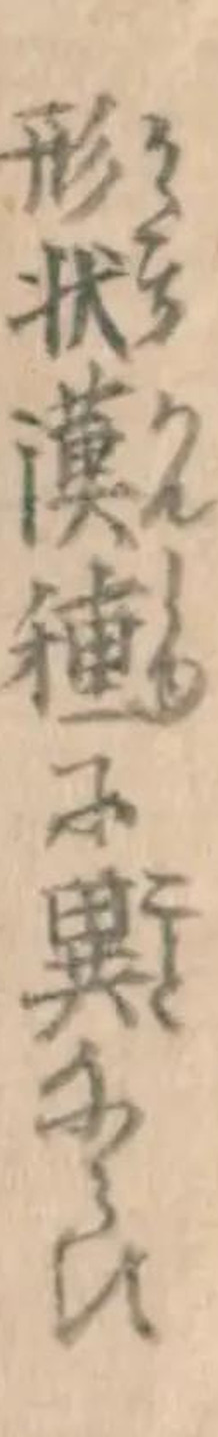形状漢種に異ならす
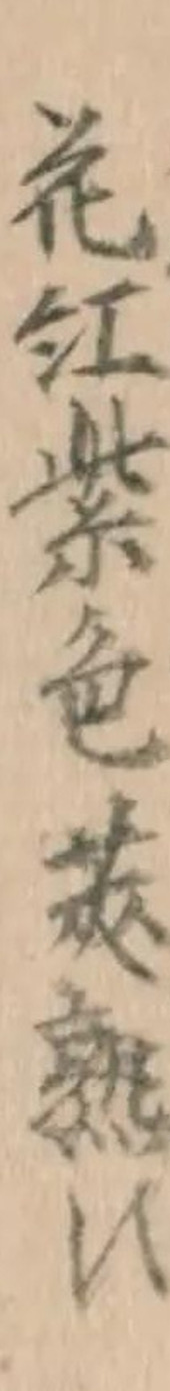花紅紫色莢熟す
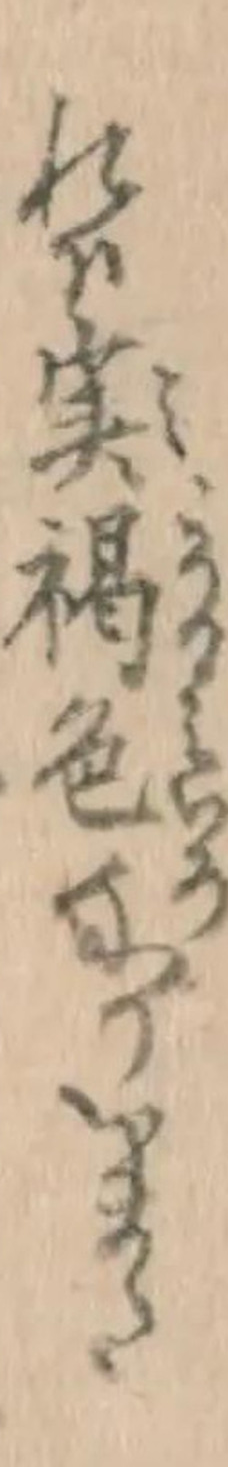れは実褐色なりいまた
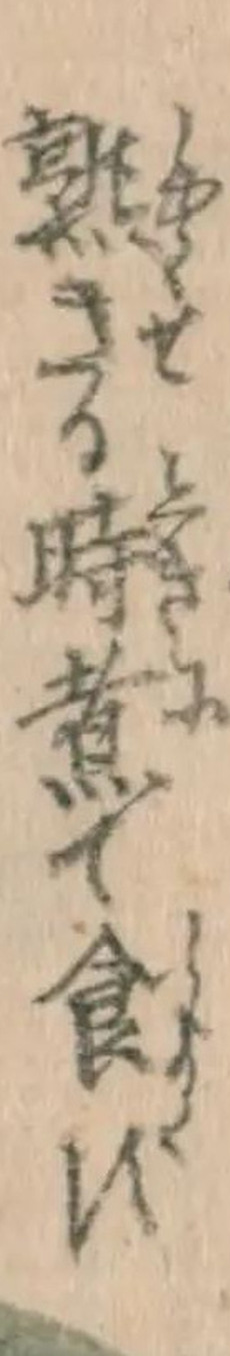熟きる時煮て食す

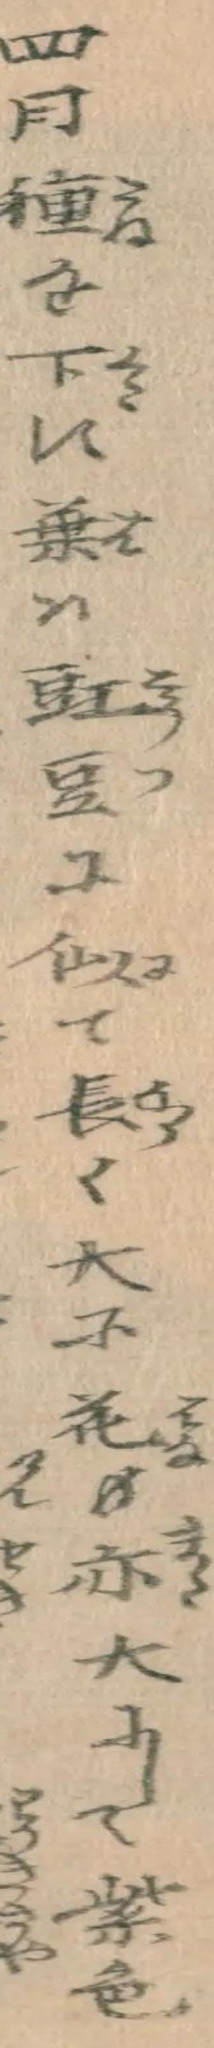四月種を下す葉は豇豆に似て長く大に花も亦大にして紫色
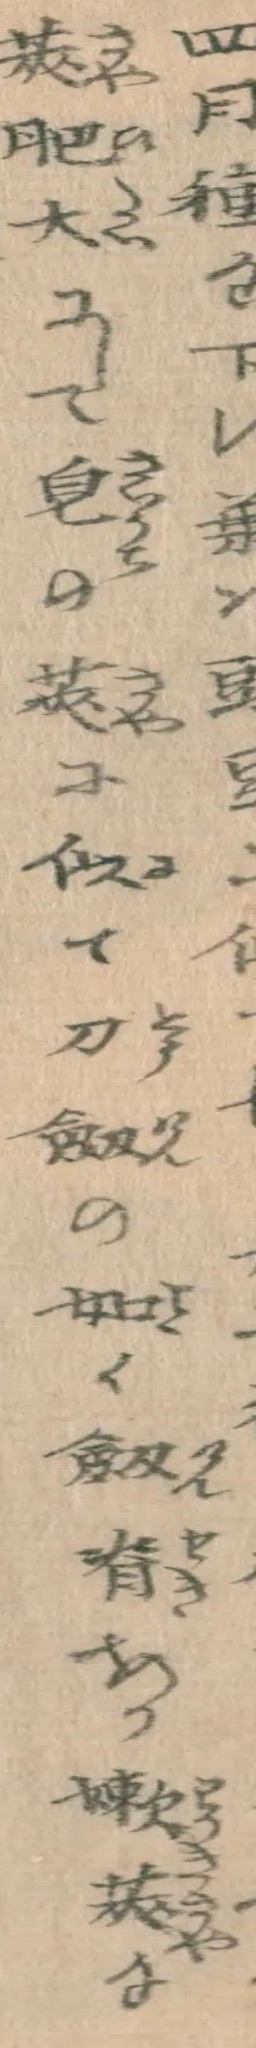莢肥大にして皀の莢に似て刀剣の如く剣脊あり嫩莢を
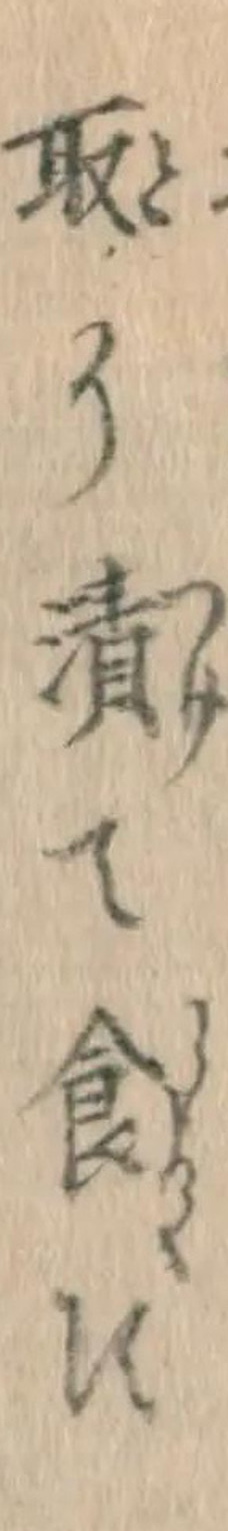取り漬て食す
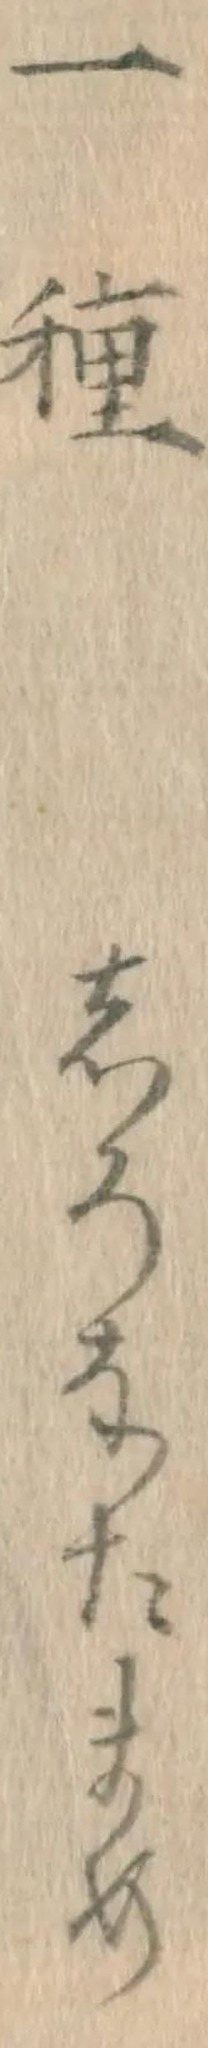一種しろなたまめ
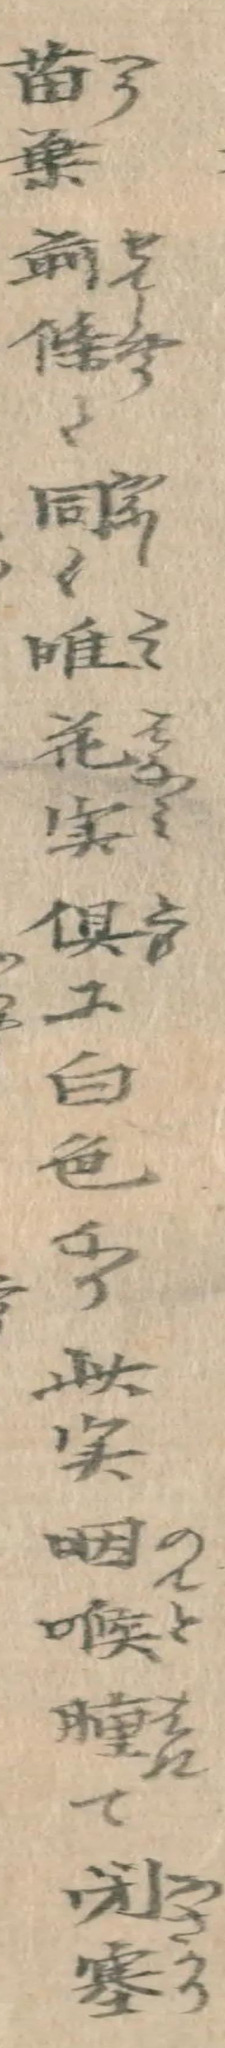苗葉前条と同く唯花実倶に白色なり此実咽喉腫て閉塞
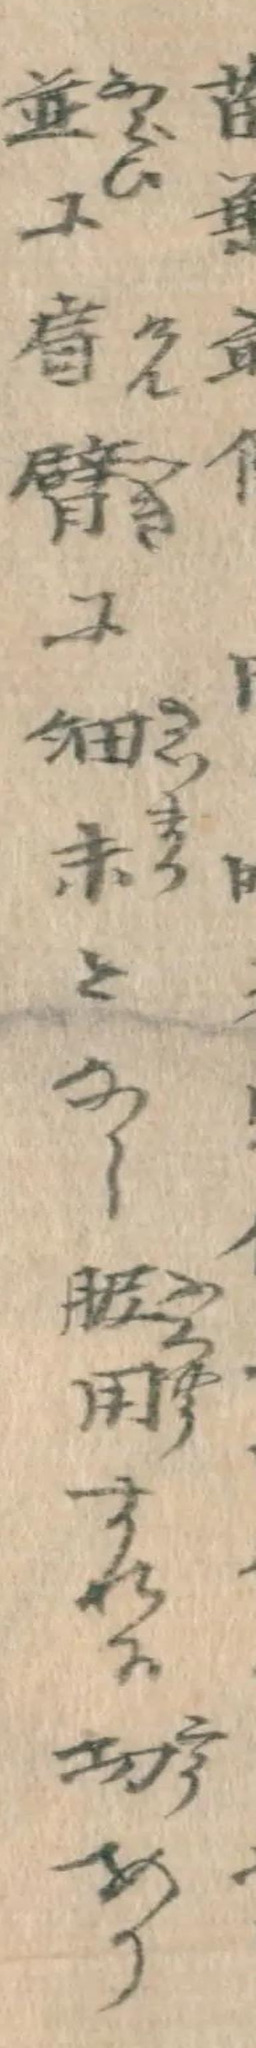並に肩臂に細末となし服用すれは功あり
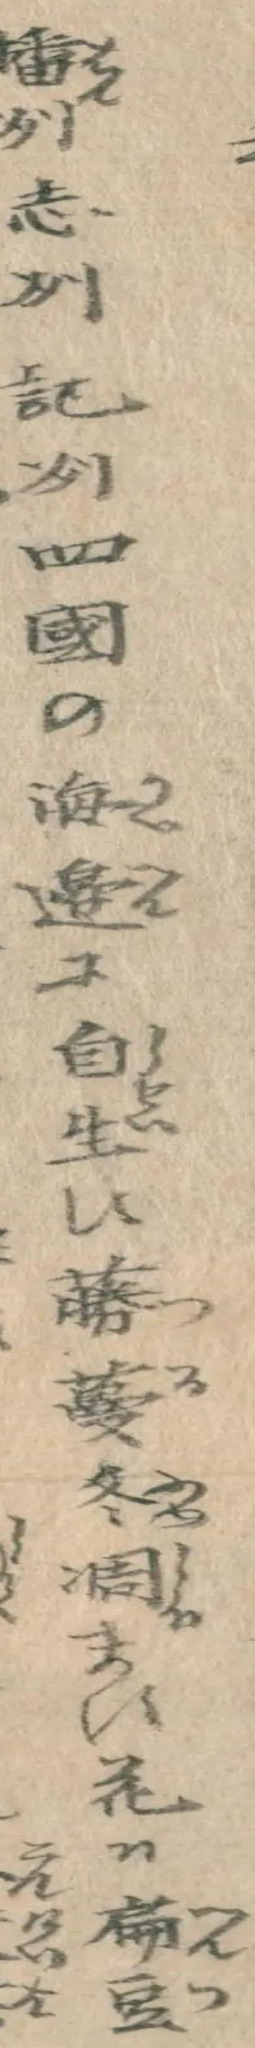播州志州記州四国の海辺に自生す蕂蔓冬凋ます花は扁豆
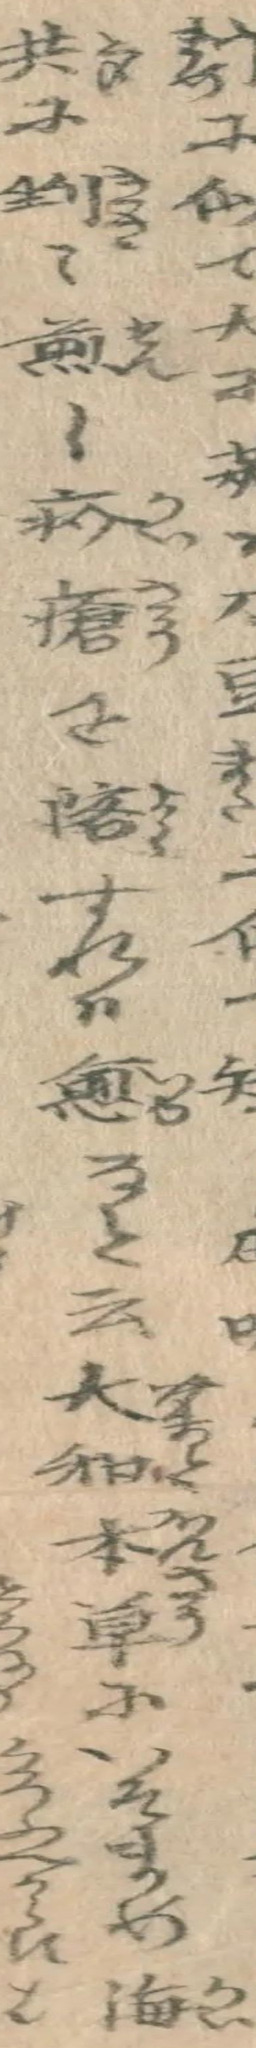共に剉み煎し疥瘡をすれは癒ると云大和本草にいそまめ海
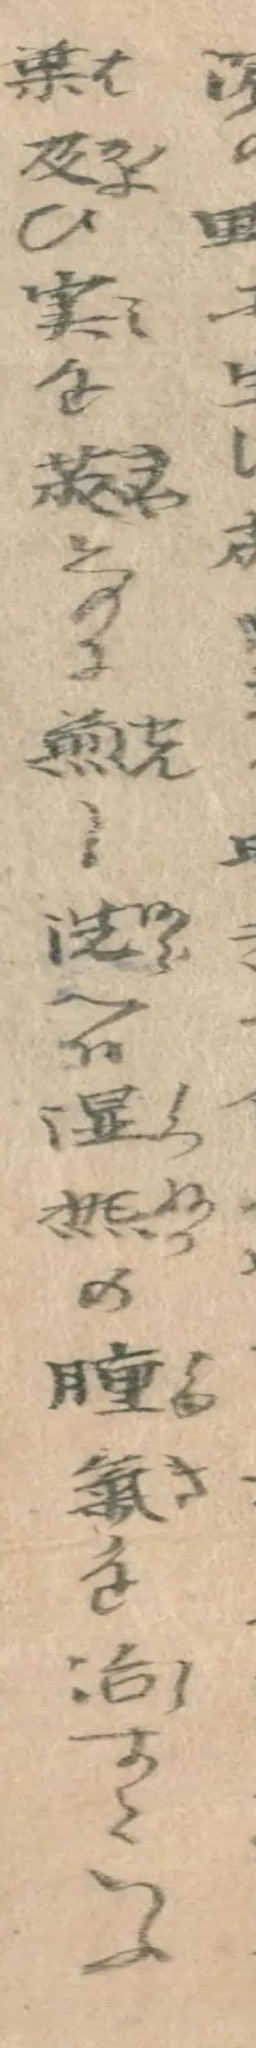葉及ひ実を莢ともに煎し洗へは湿熱の腫気を治すといふ

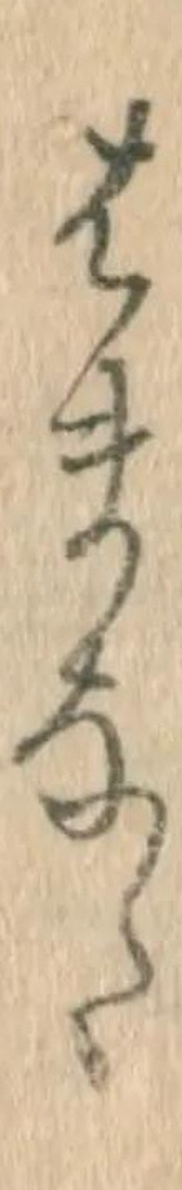はまなた
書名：本草図譜. 巻43-45
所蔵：国立国会図書館 National Diet Library, JAPAN
